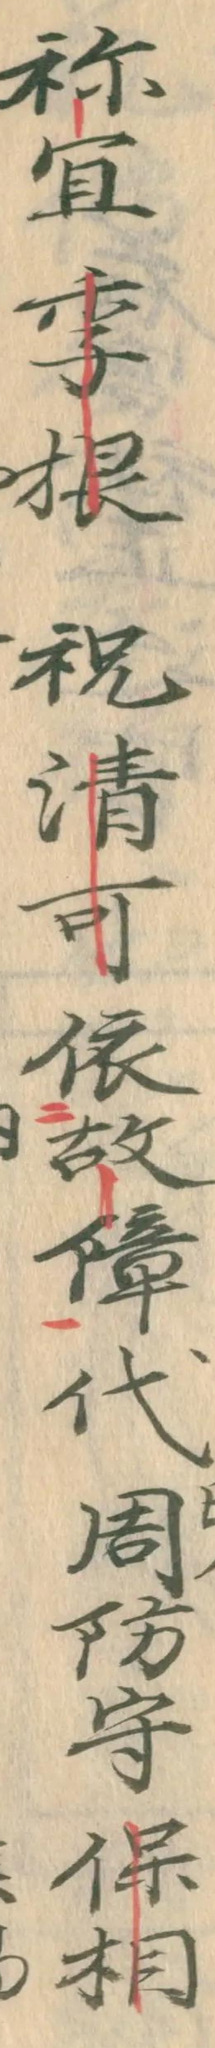祢-宜季根祝清可依故-障代周防守保相
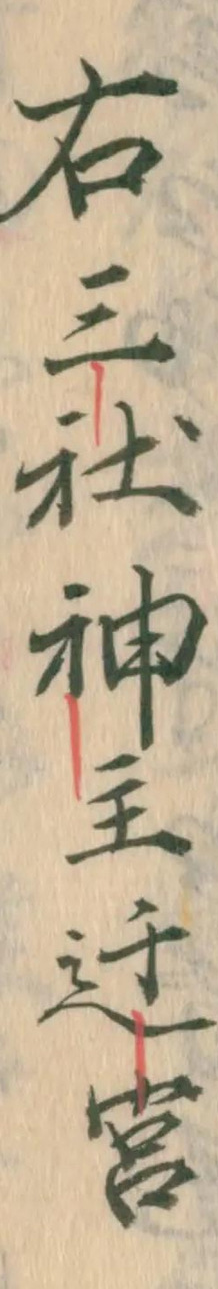右三-社神_主迁-宮
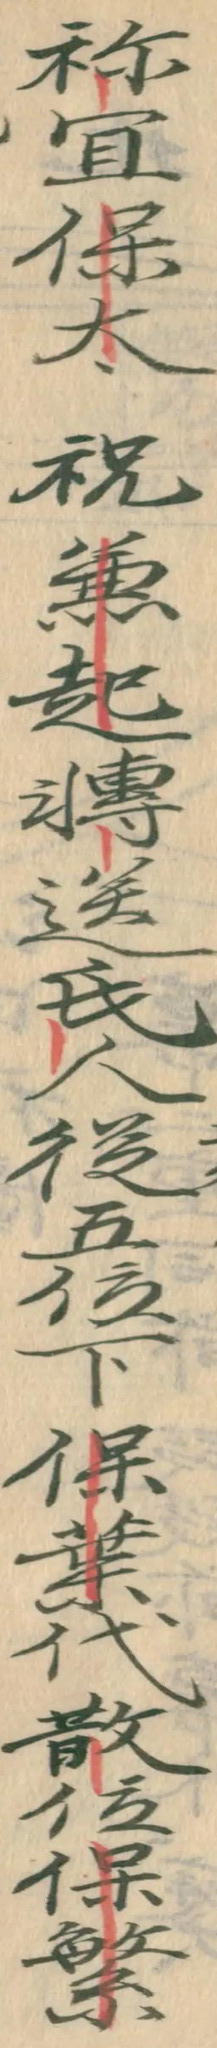祢-宜保太祝兼起転-送氏従五位下保葉代散-位保繁
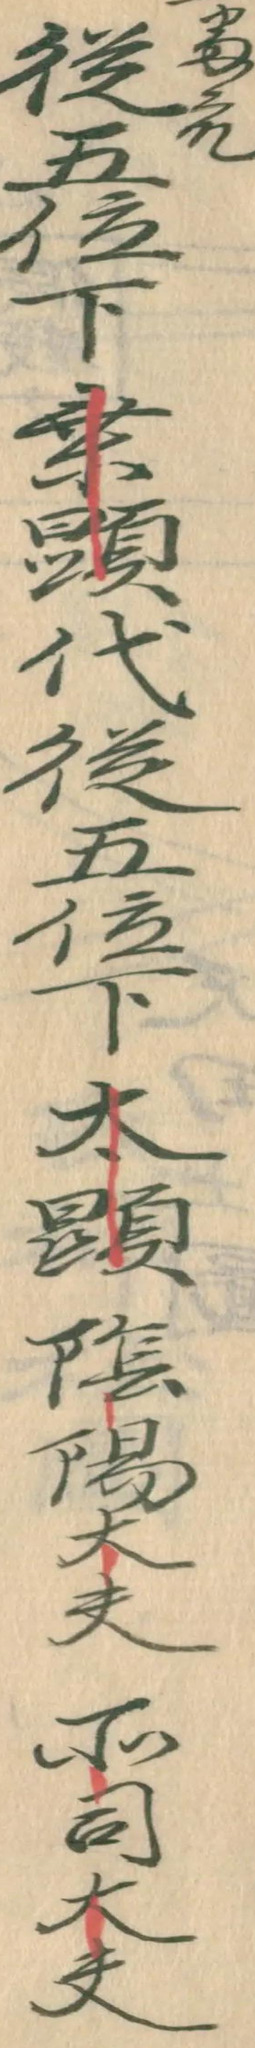従五位下桒顕代従五位下太顕陰-陽大-夫所-司大-夫
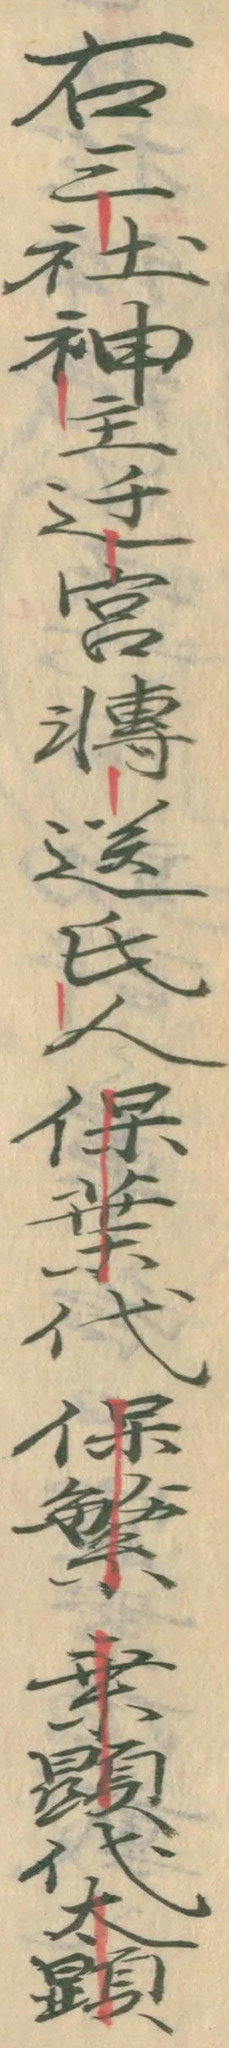右三-社神_主迁-宮転-送氏保葉代保繁桒顕代太顕

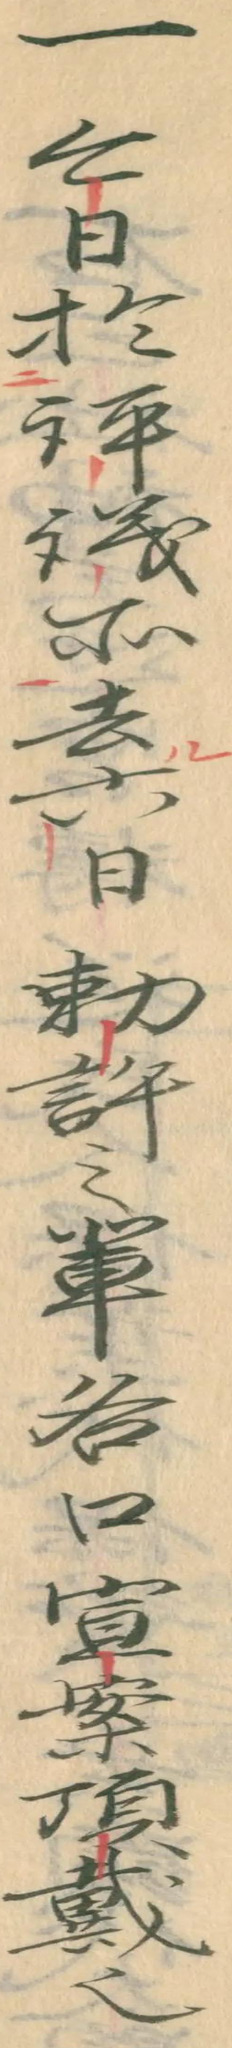一今-日於評-議-所去六日勅-許之輩各口宣-案頂-戴也
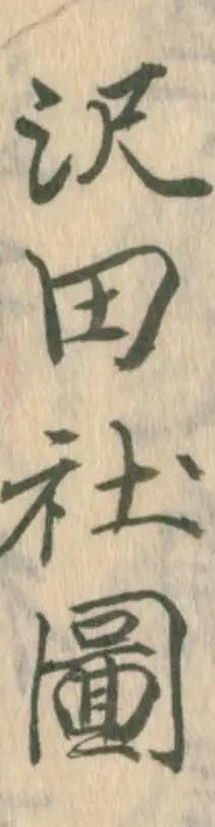沢田社図
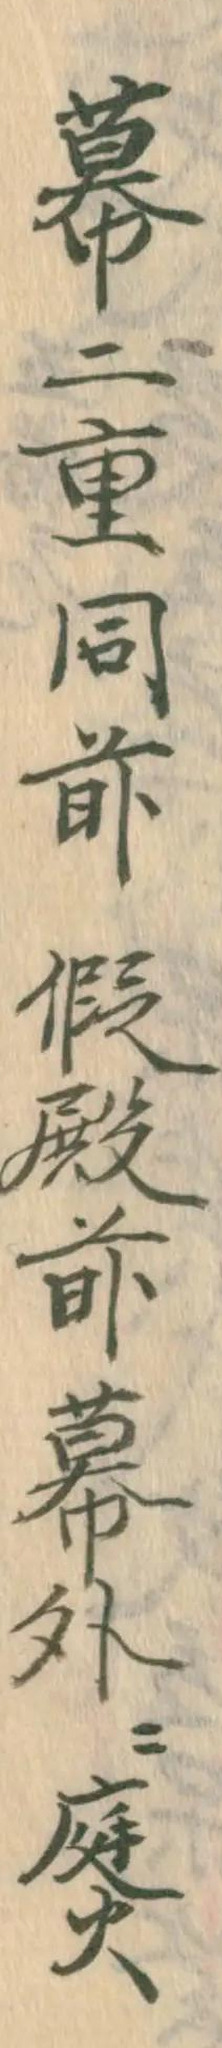北河幕二重同前仮殿前幕外ニ庭火
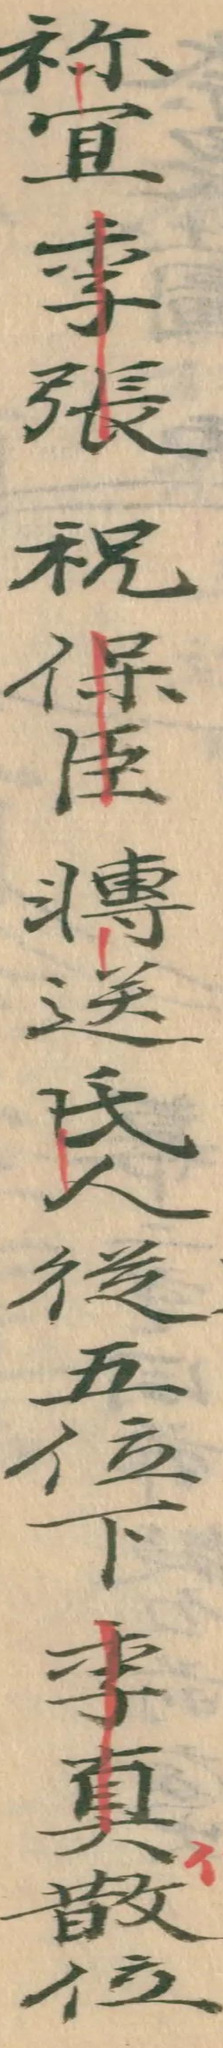祢-宜季張祝保臣轉-送氏従五位下季真散位
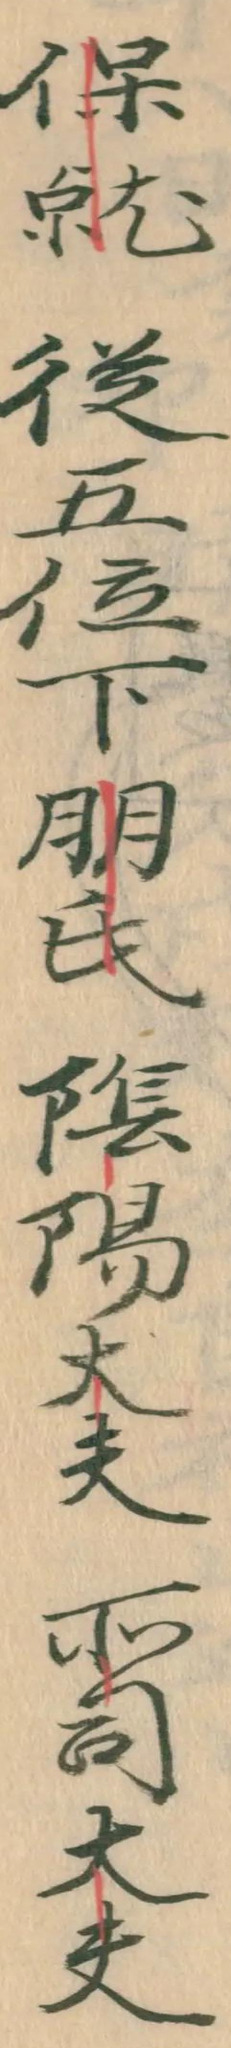保就従五位下朋氏陰-陽大-夫所-司大-夫
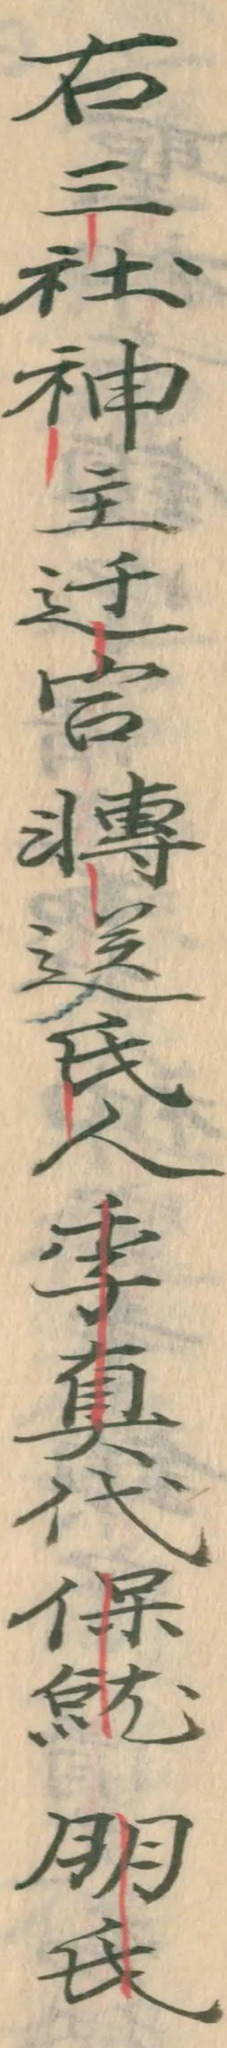右三-社神_主迁-宮転-送氏季真代保就朋氏

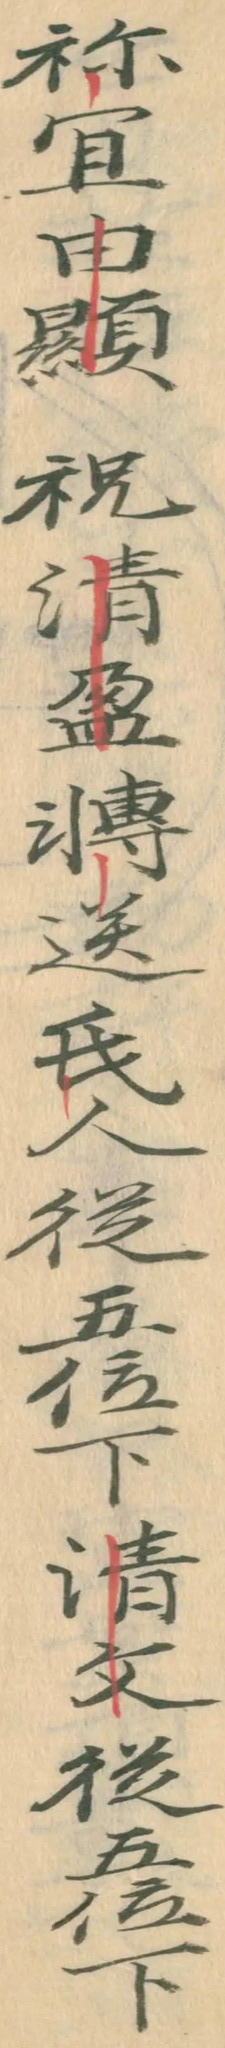祢-宜由顕祝清盈転-送氏従五位下清文従五位下
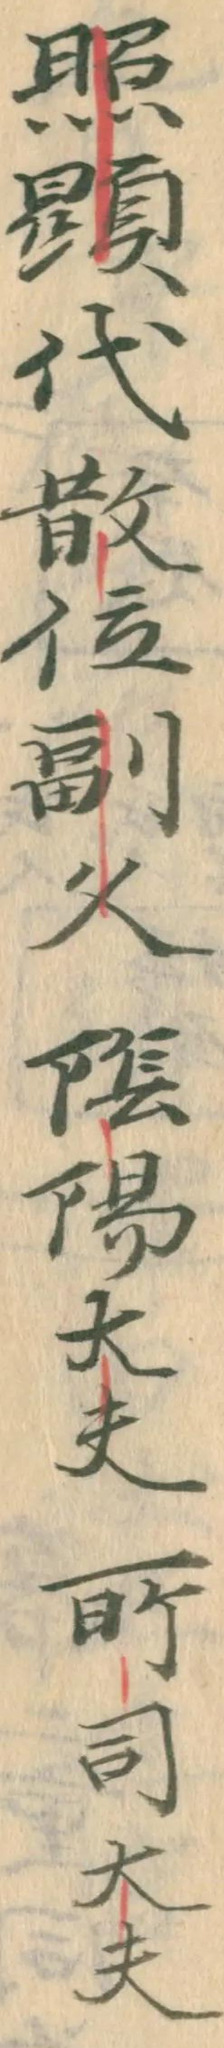照顕代散-位副久陰-陽大-夫所-司大-夫
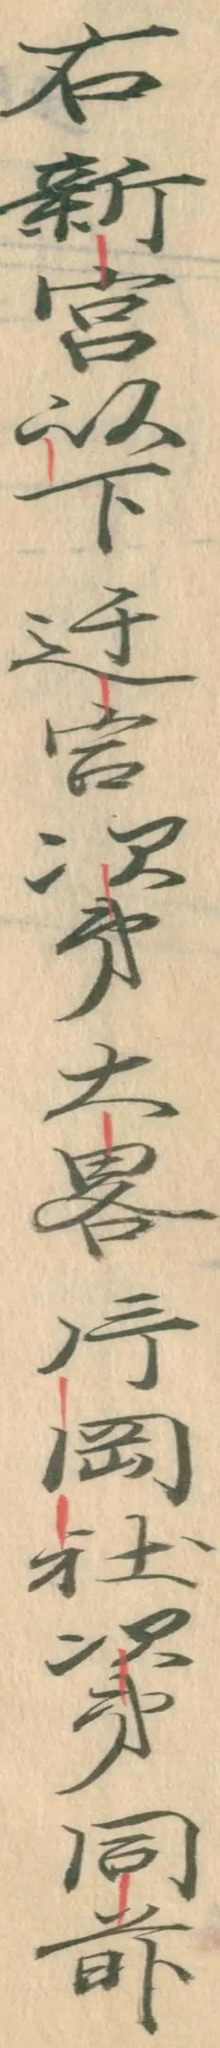右新-宮以迁-宮次-第大-略片_岡_社次-第同-前
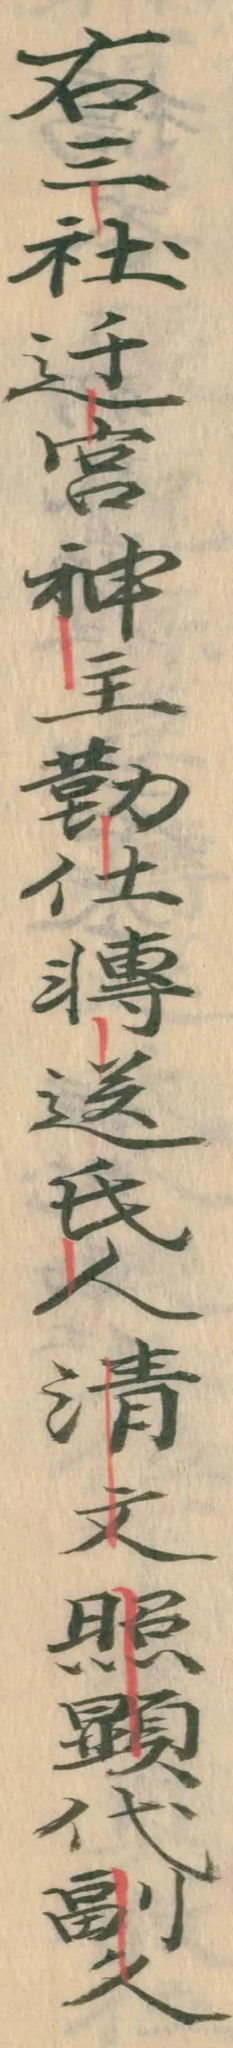右三-社迁-宮神_主勤-仕転-送氏清文照顕代副久
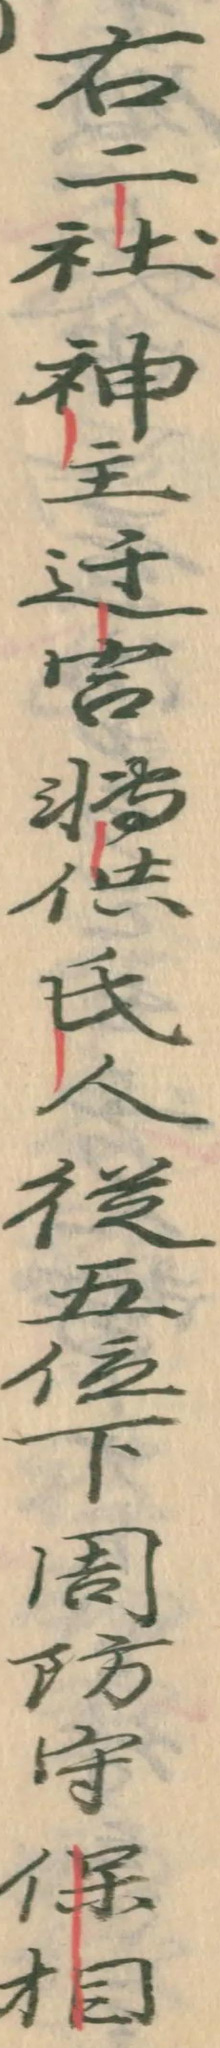右二-社神_主迁-宮転-供氏従五位下周防守保相
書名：賀茂社記録. 第16冊
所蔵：国立国会図書館 National Diet Library, JAPAN
